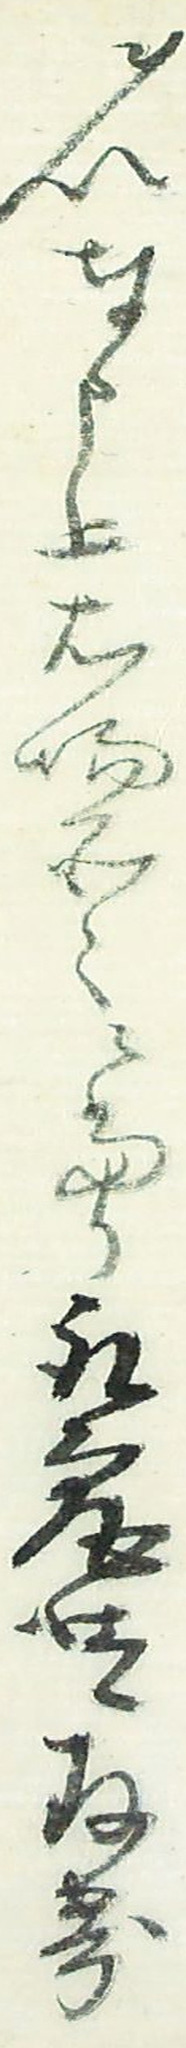を以奉申上右場所〳〵に当り取究仕候存寄
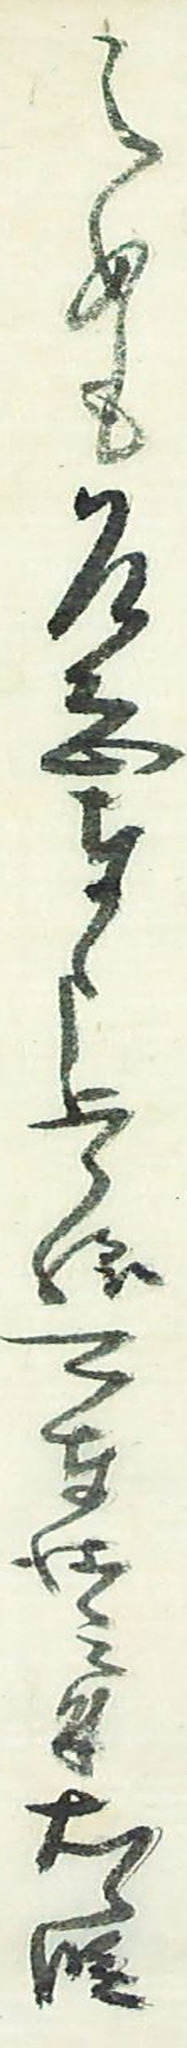之義も乍恐奉申上候様可奉仕に付右之段
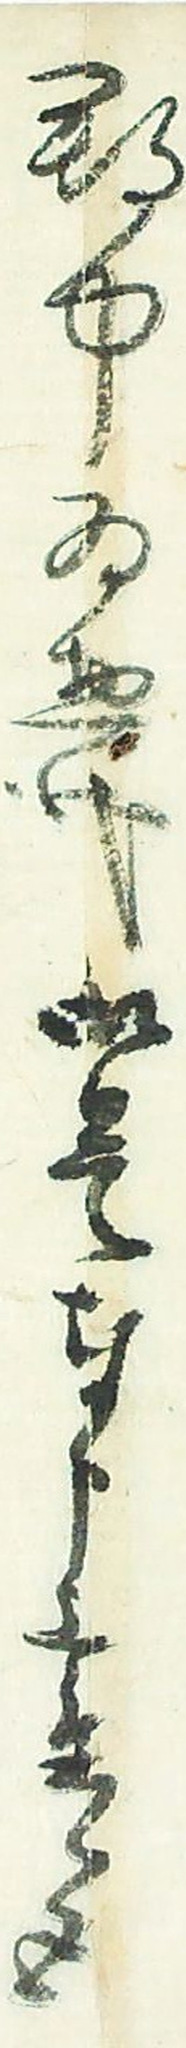郡中為惣代以是奉申上置候以上
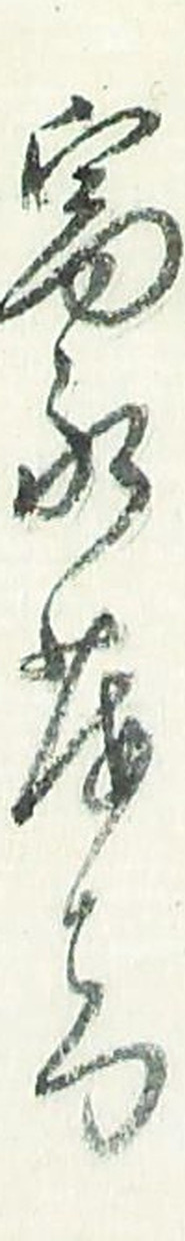富永茂右衛門
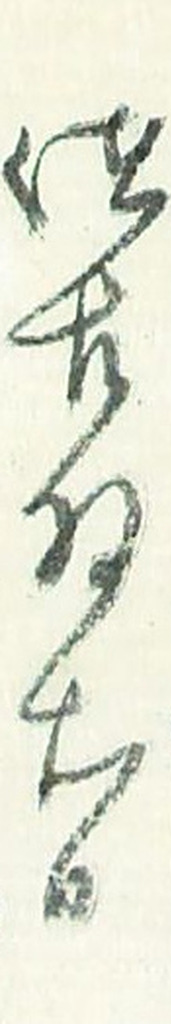早淵村右同
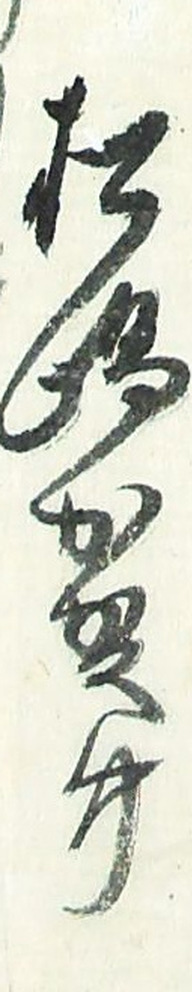松嶋加賀介
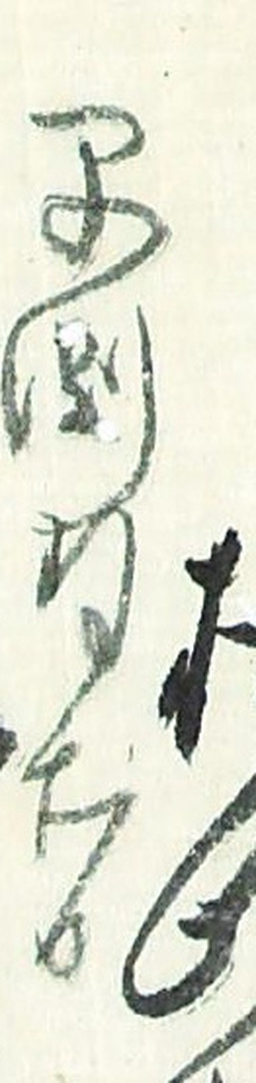早淵村右同
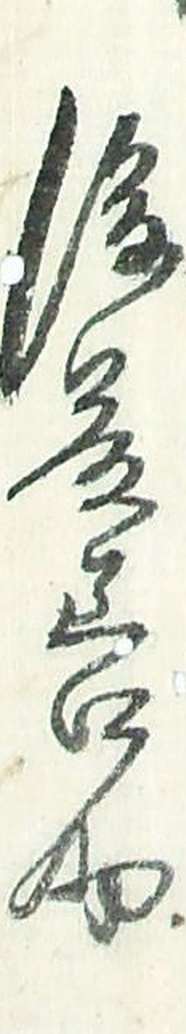後藤善助
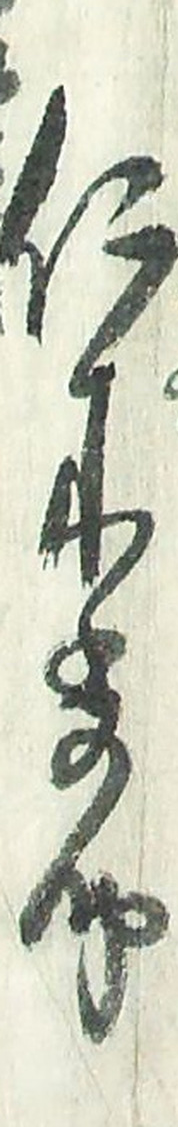仁木秀助
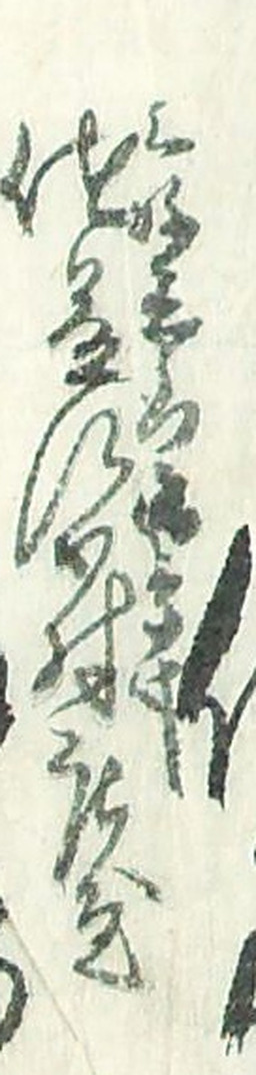佐藤つか村庄屋

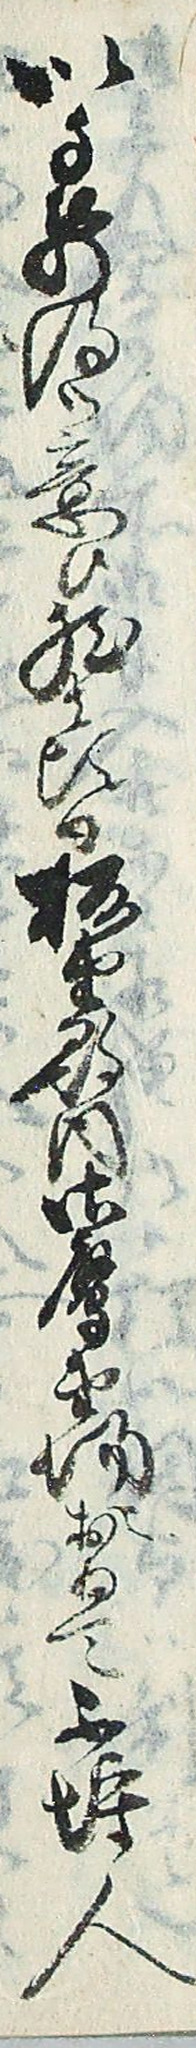以手帋得御意候然は頃日板野郡内御鷹野場において不埒人
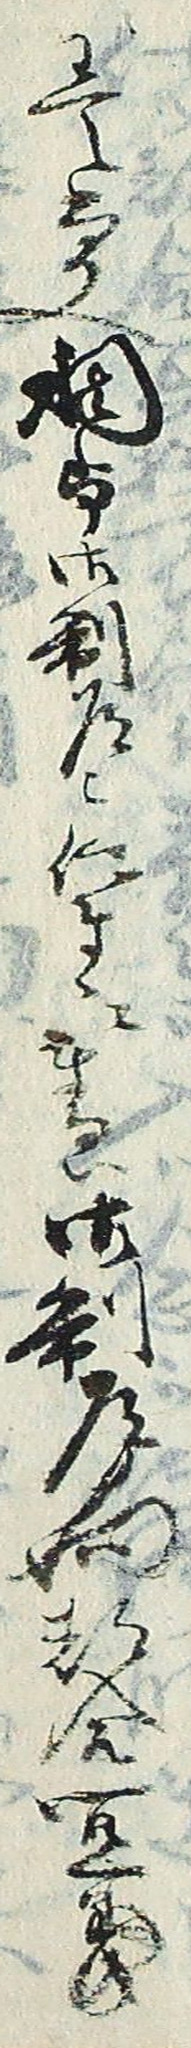有之尚又稠布御制道被仰付に付而は御制道向都合宜義
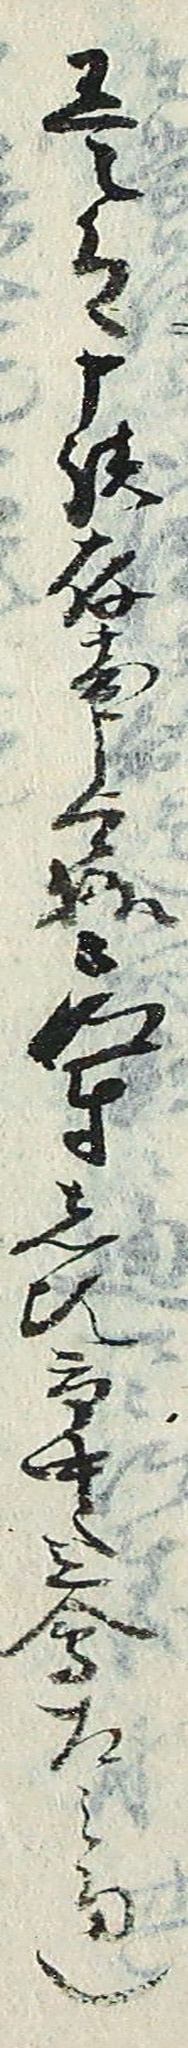有之候はゝ申談存寄申上候様被仰付先頃市中へ立会左之通
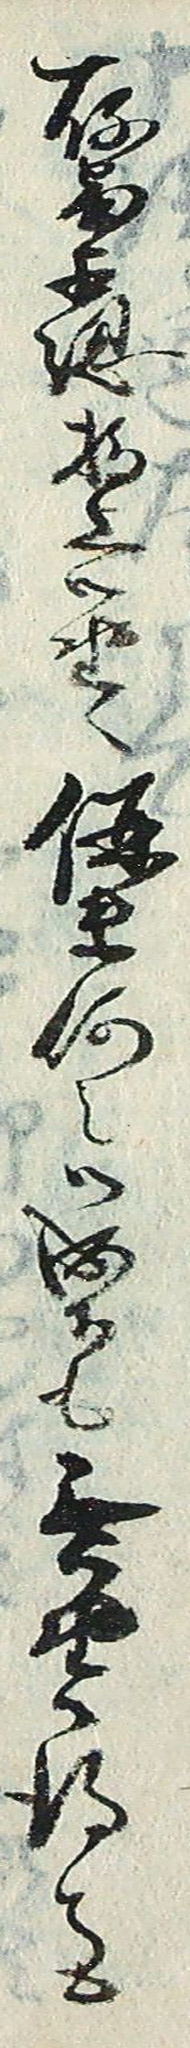存寄相認指上御坐候併未何之御成下も無御坐候得とも
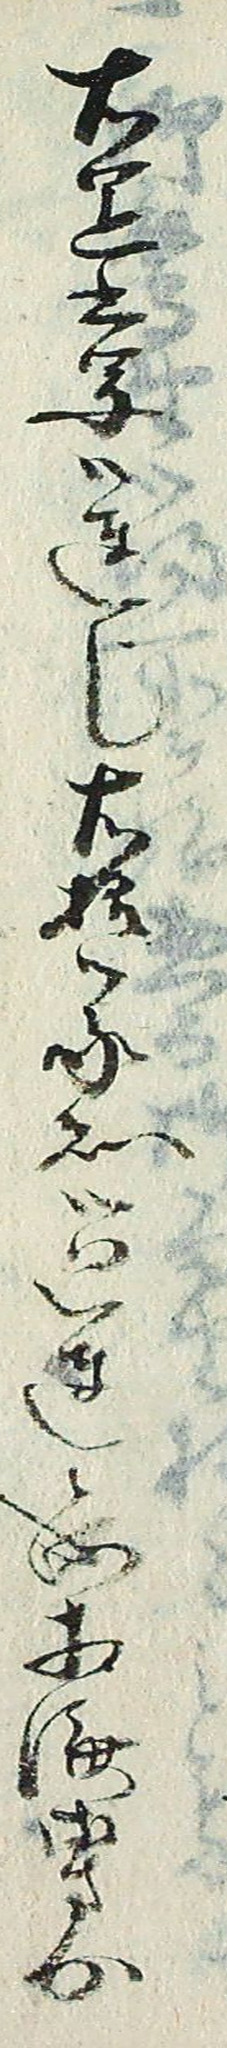右運書写御達申候右様御承知御廻達被成相済候御方ゟ
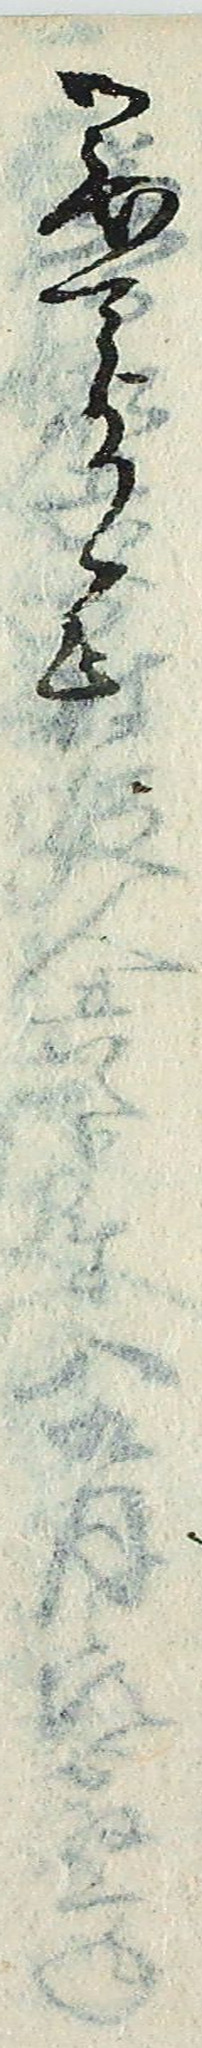御戻可被下候以上
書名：諸御用御□受書控
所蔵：鳴門教育大学 Naruto University of Education
